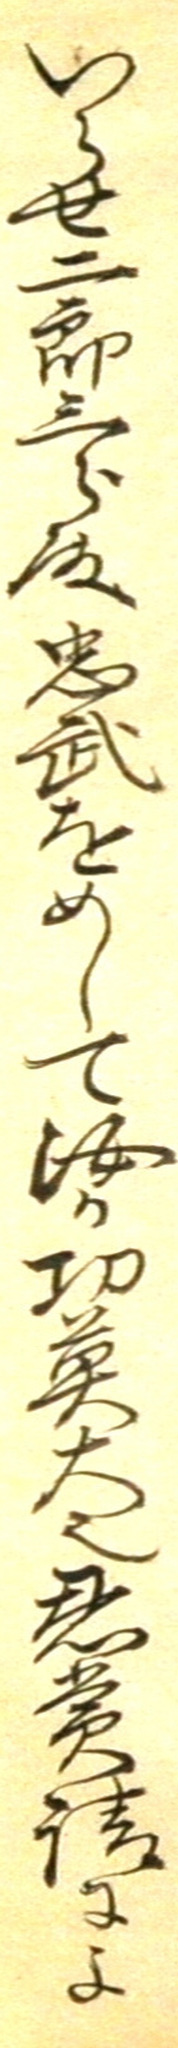いらせ二郎三郎殿忠武をめして汝か功莫大也恩賞請によ
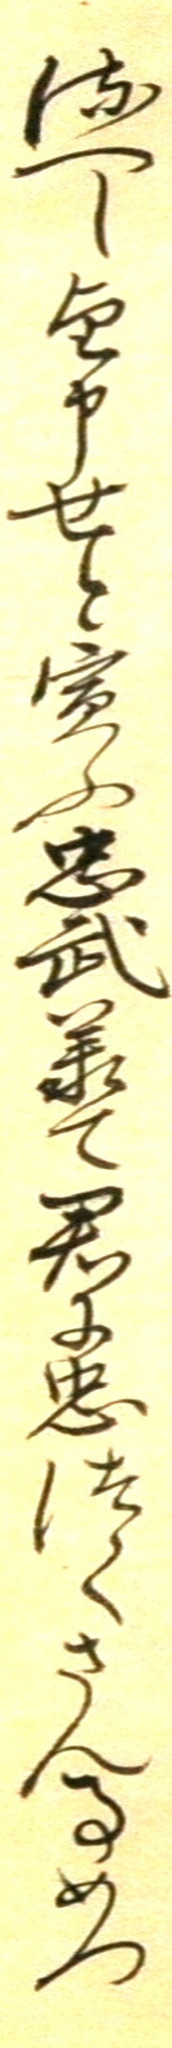るへし望申せと宣ふ忠武承て君に忠つくさん事めつ

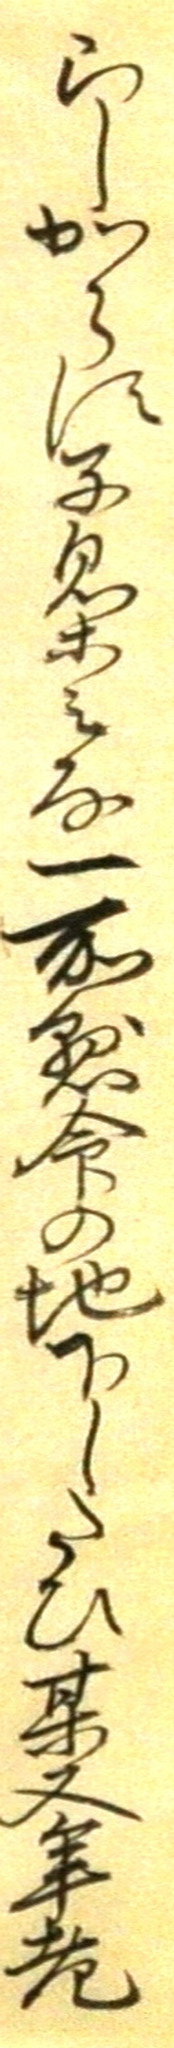らしからす子息等みな一所懸命の地下したひ某又年老
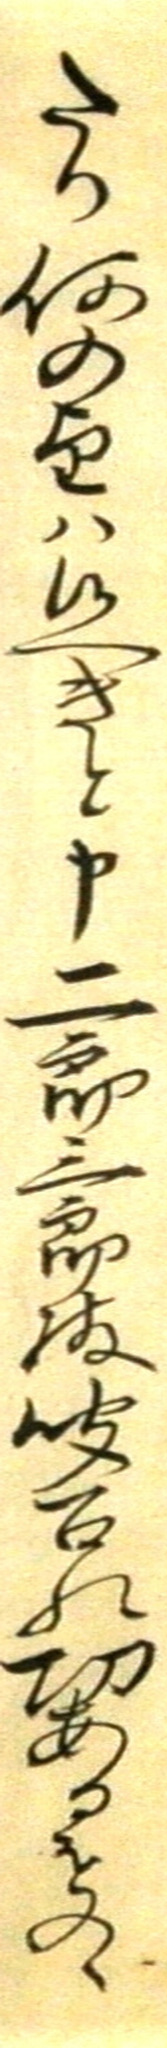たり何の望は候へきと申二郎三郎殿聞召れ功あるものゝ
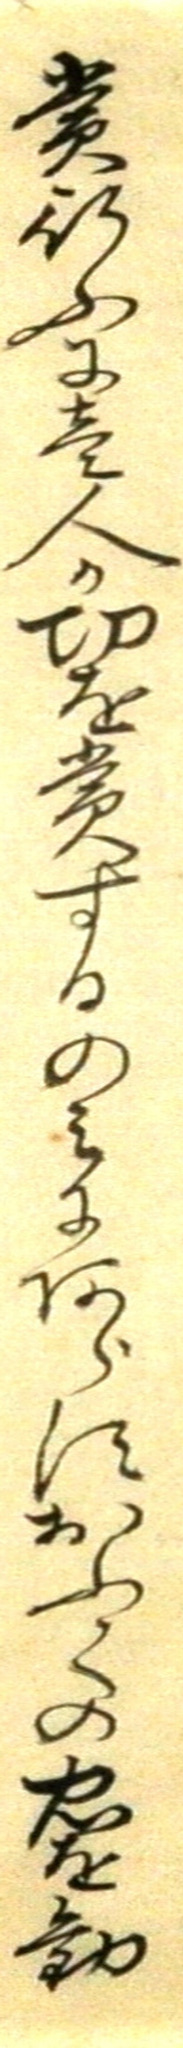賞行ふに壱人か功を賞するのみにあらすおふくの忠を勧
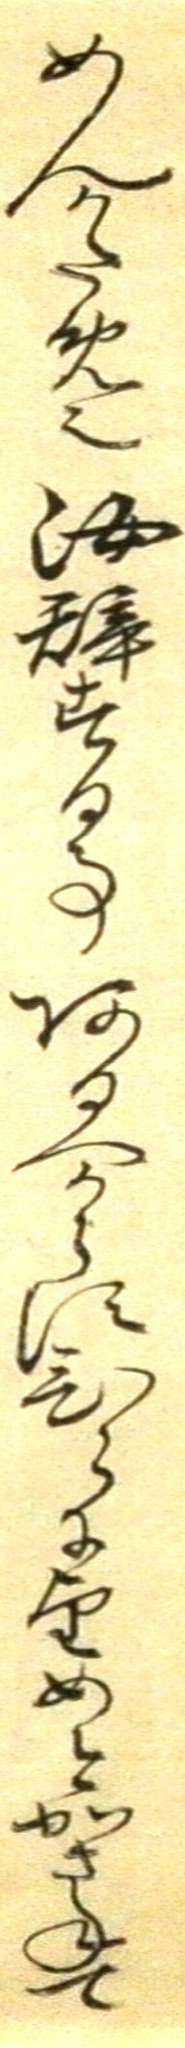めんかため也汝辞する事あるへからすひらに望めとかさねて
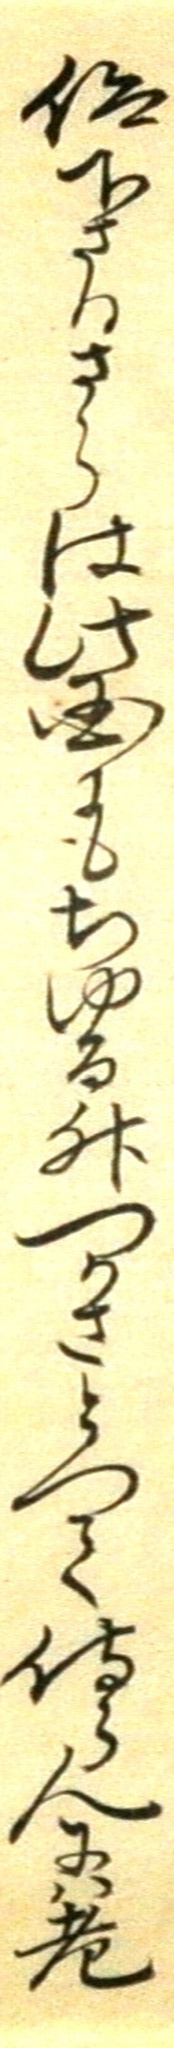仰下さるさらは此国にもちゆる升つかさとつて侍らんには老
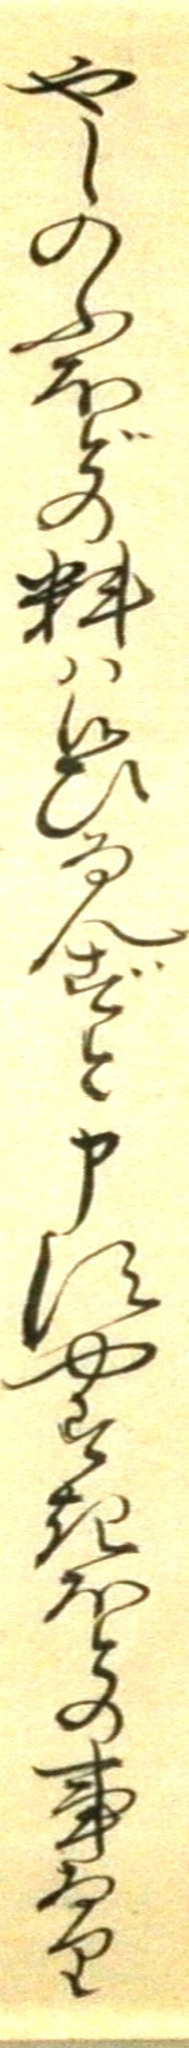やしのふほどの料は候ひなんずと申すやすきほとの事なり
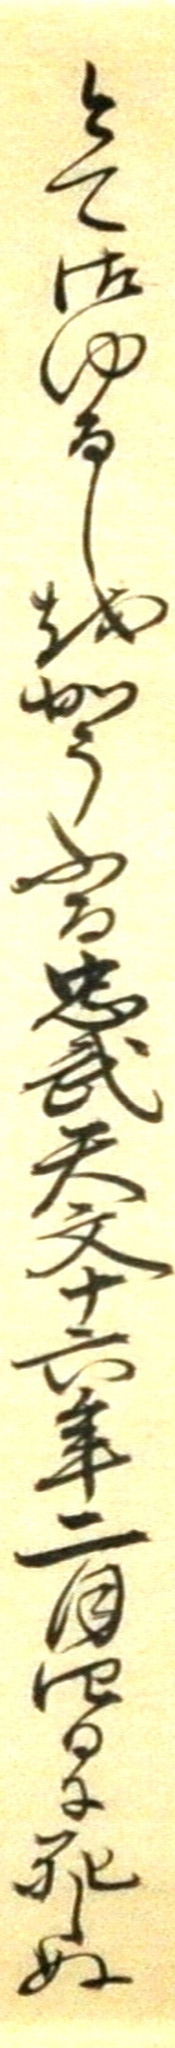とて御ゆるしをかうふる忠武天文十六年二月四日に死しぬ
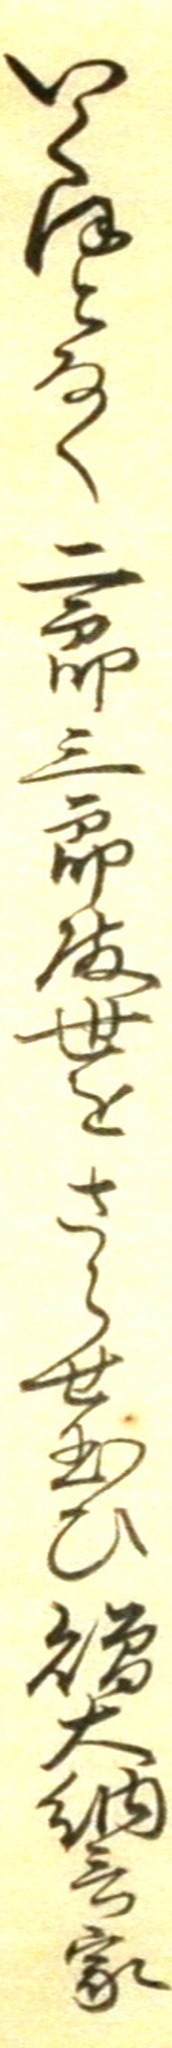いくほとなく二郎三郎殿世をさらせ玉ひ贈大納言家
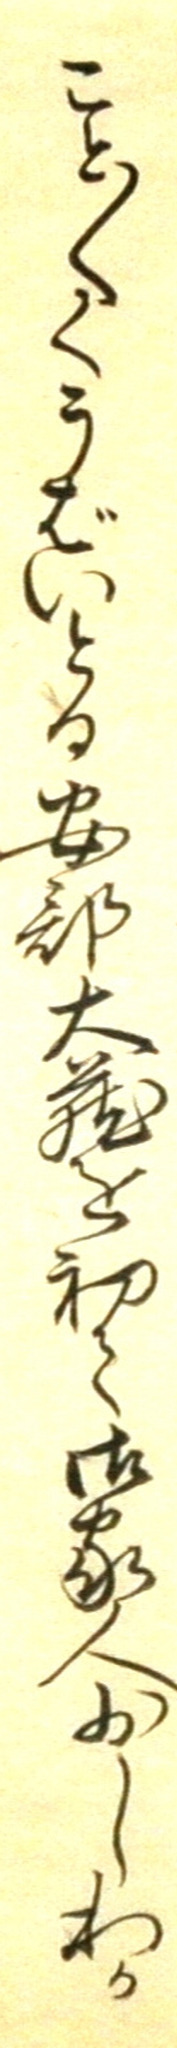こと〳〵くうばいとる安部大蔵を初て御家人少しわか
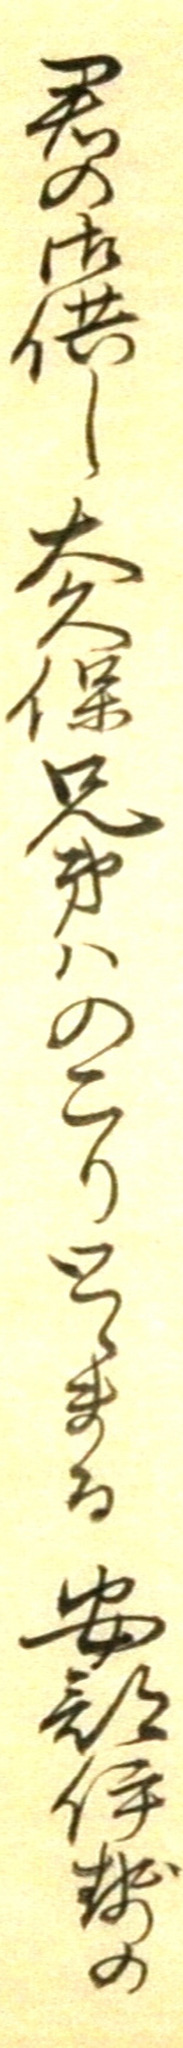君の御供し大久保兄弟はのこりとゝまる安部伊勢の
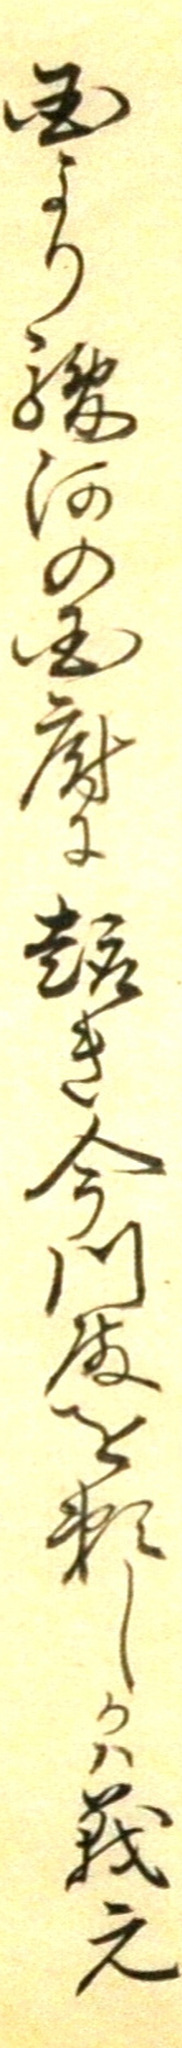国より駿河の国府に趣き今川殿を頼しかは義元
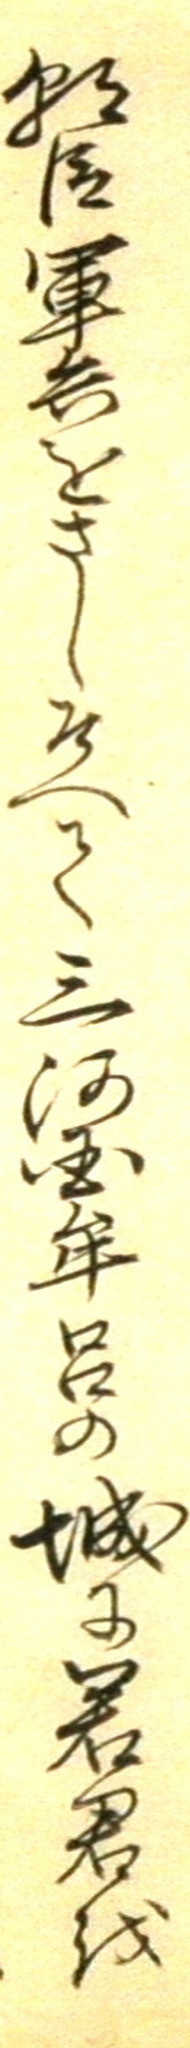朝臣軍兵をさしそへて三河国牟呂の城に若君を

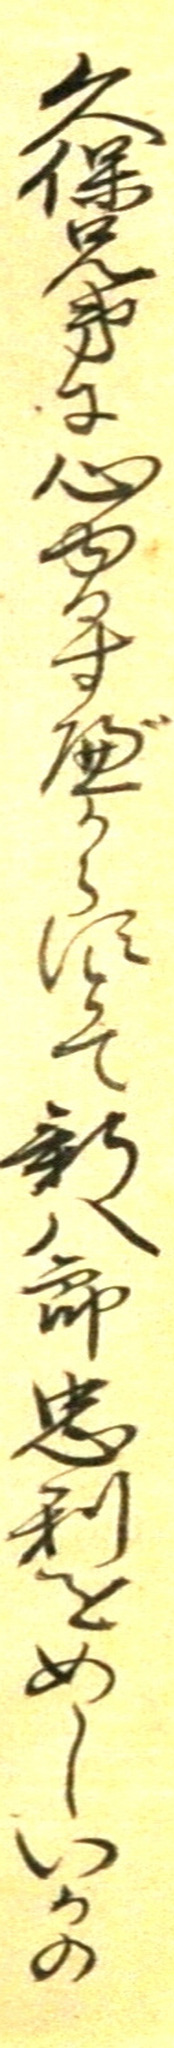久保兄弟に心ゆるすべからすとて新八郎忠利をめしいかの
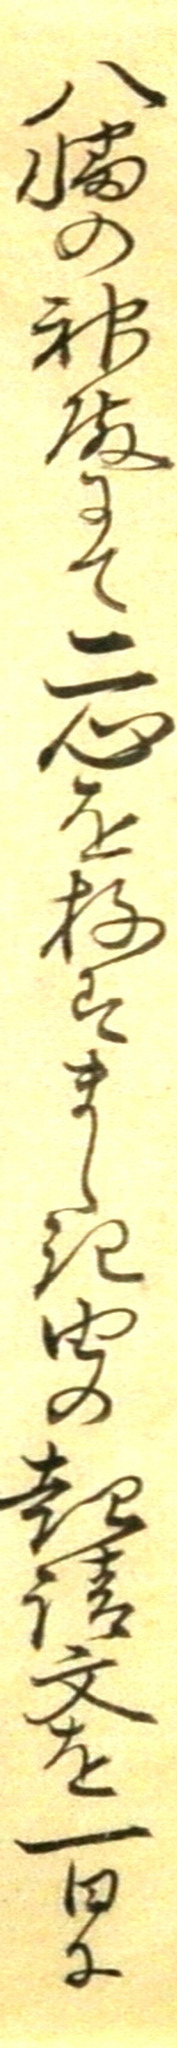八幡の神殿にて二心を存すましき由の起請文を一日に
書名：藩翰譜（四・中）
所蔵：伊那市立高遠町図書館・合同会社AMANE
